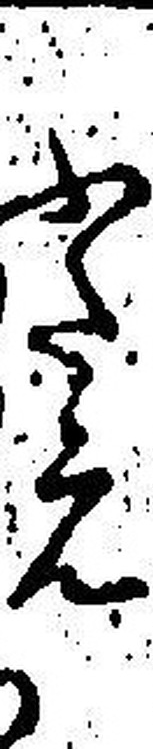ふたへ
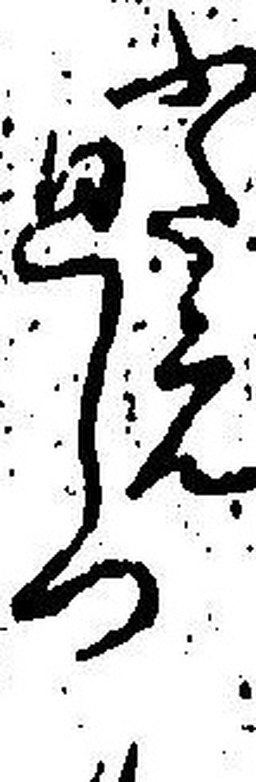廻しつ

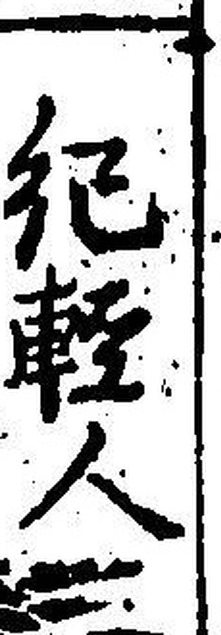紀軽人
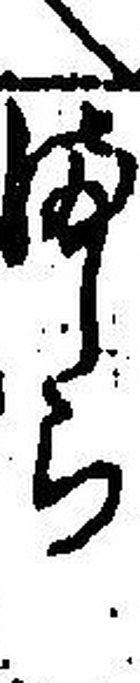ましら
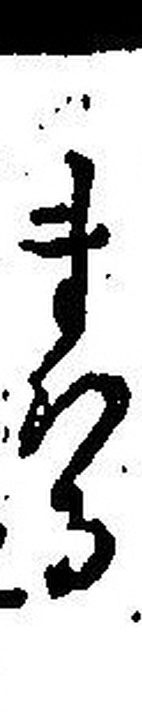まはる
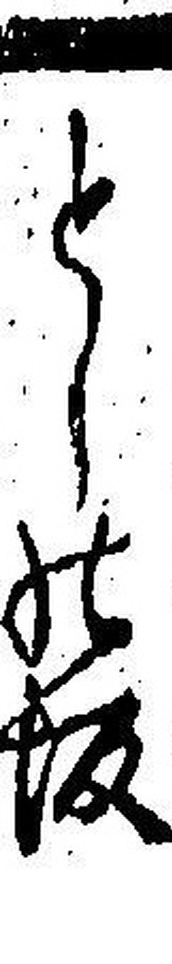としの坂
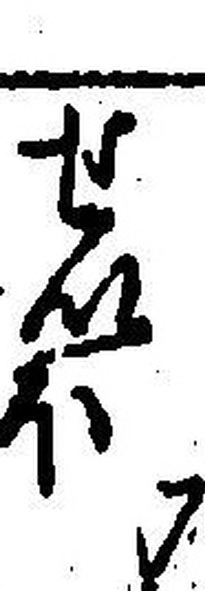せいほ
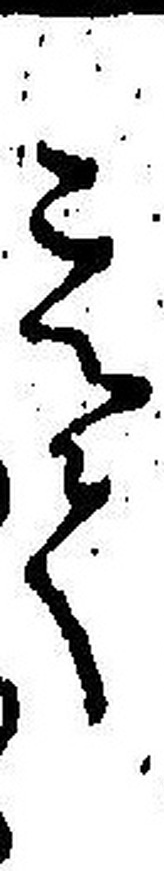こへて
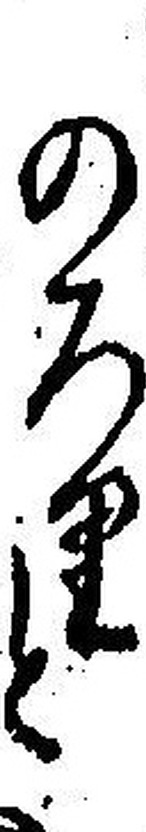のろりと
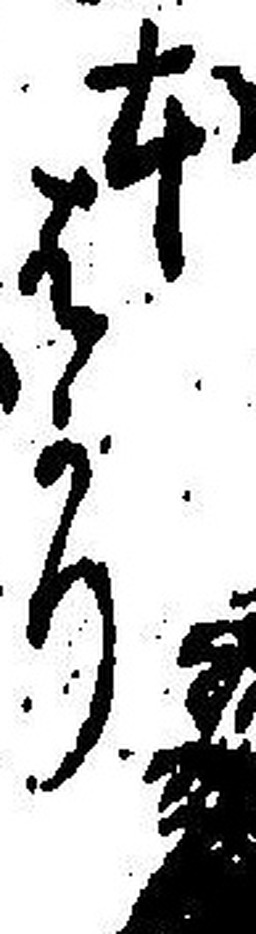はかり
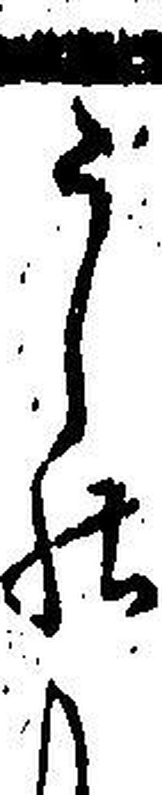うしの
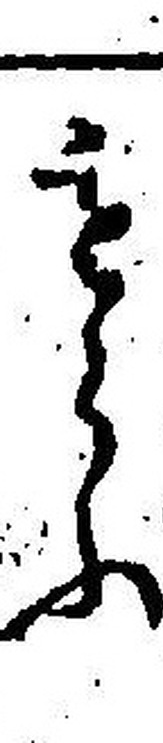もらふ
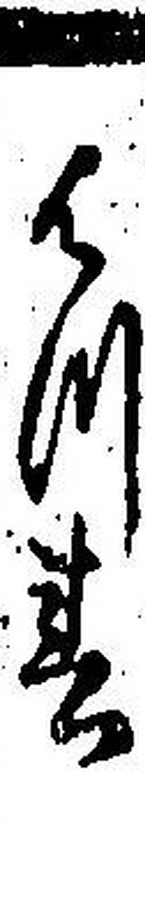はつ春
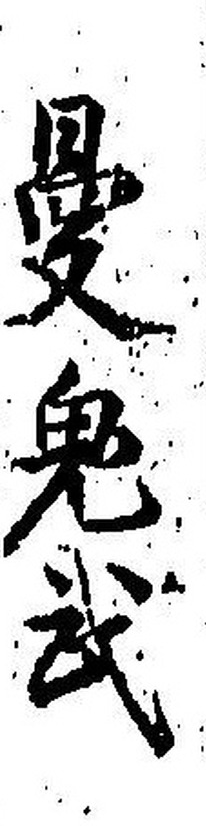曼鬼武
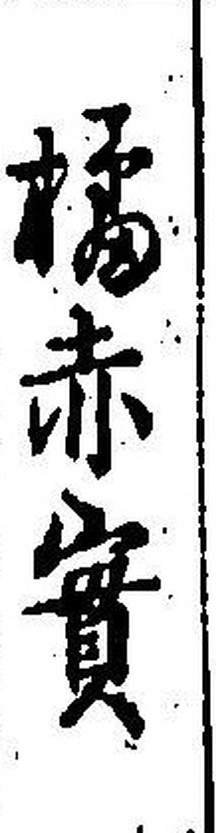橘赤実
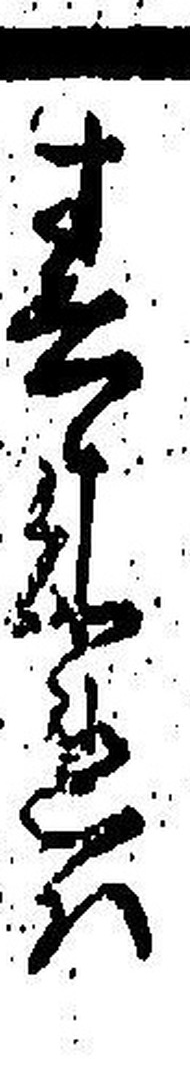春来れは
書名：どうれ百人一首 / 鹿都部真顔(狂歌堂)編
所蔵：東京大学総合図書館 General Library in the University of Tokyo, JAPAN
